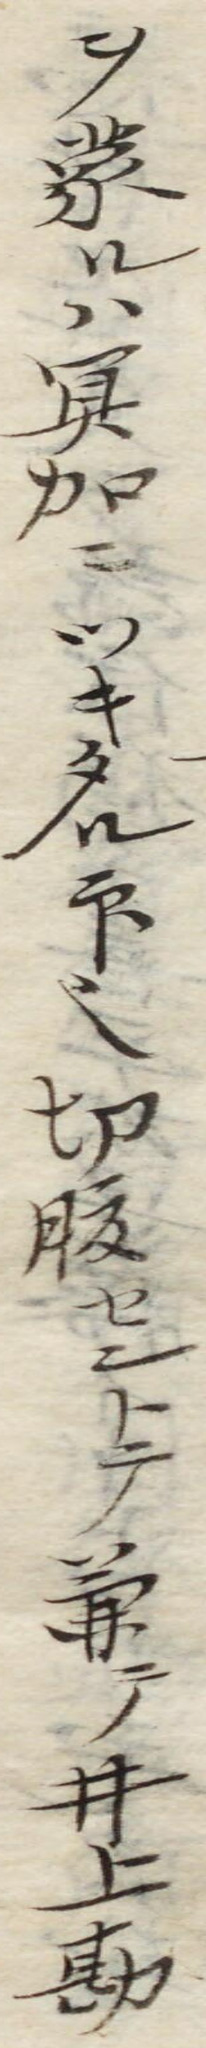ヲ蒙ルハ冥加ニツキタル印也切腹セントテ兼テ井上勘
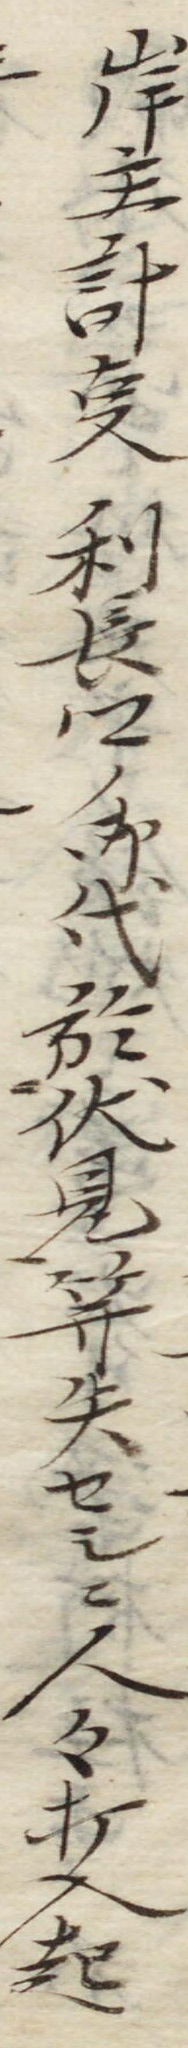一岸主計事利長卿ノ御代於伏見笄失セシニ人々打入起
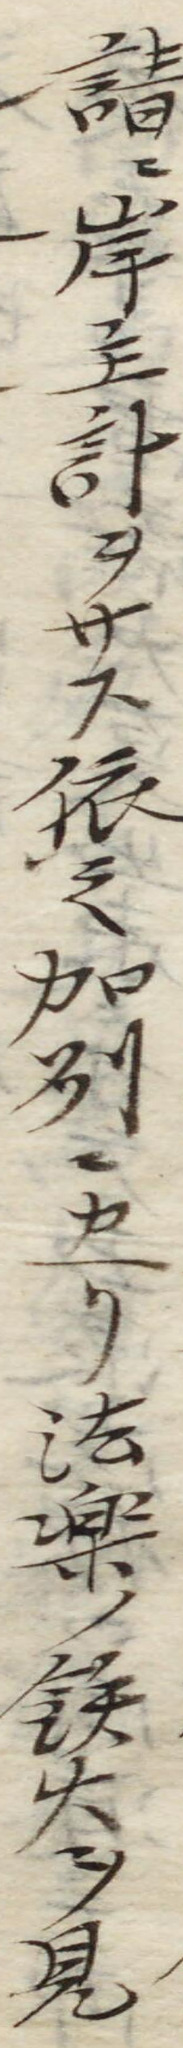請主サス依之加州カへリ法楽ノ鉄火見
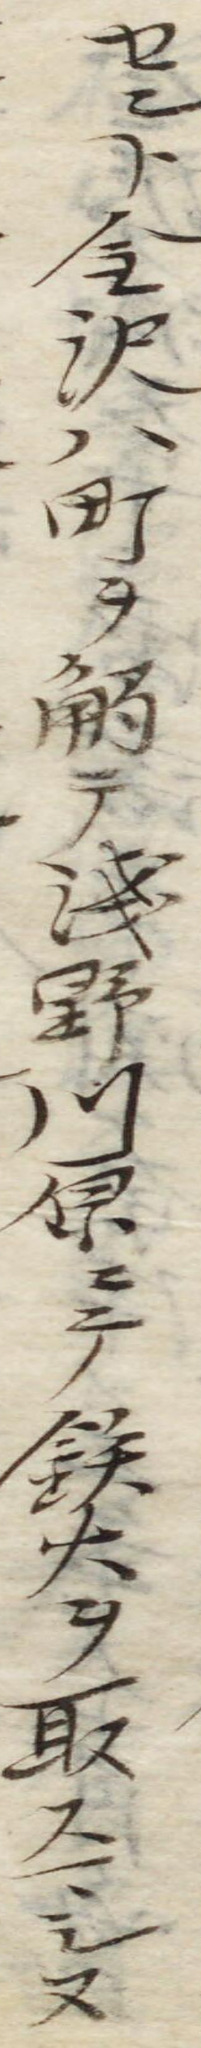セント金沢八町觸テ浅野川原ニテ鉄火取スマシヌ
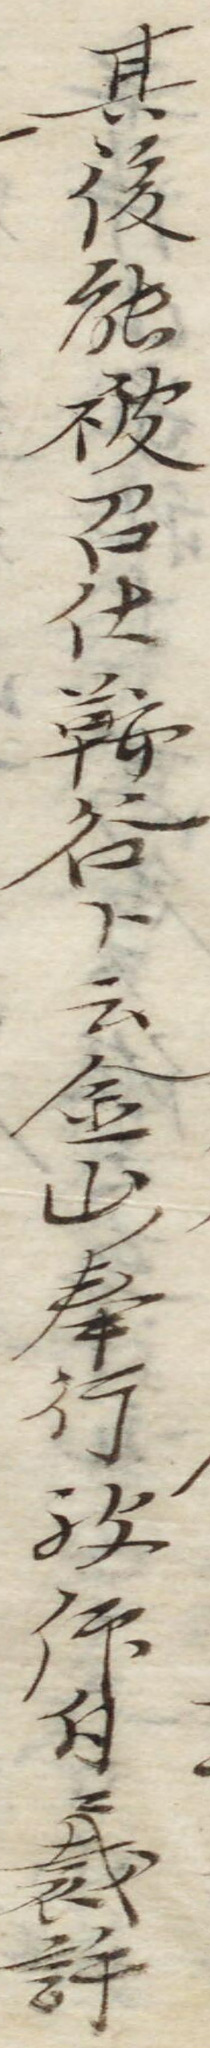其後能披召仕鞍谷ト云金山奉行役仰付裁許
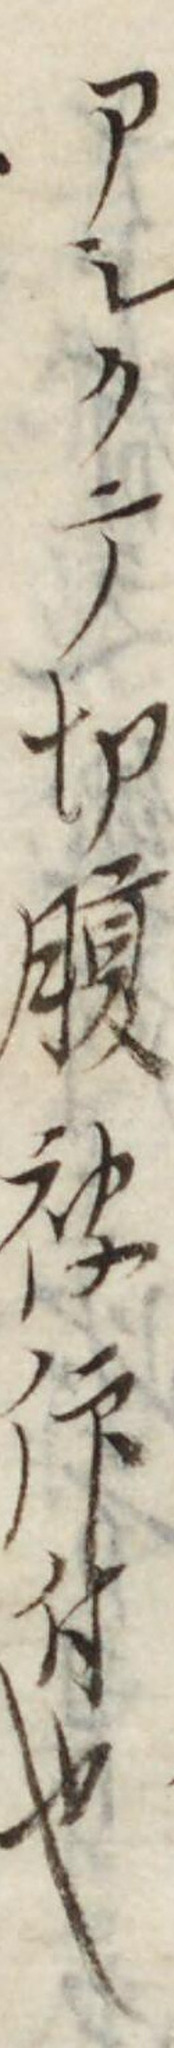アシクテ切腹被仰付也
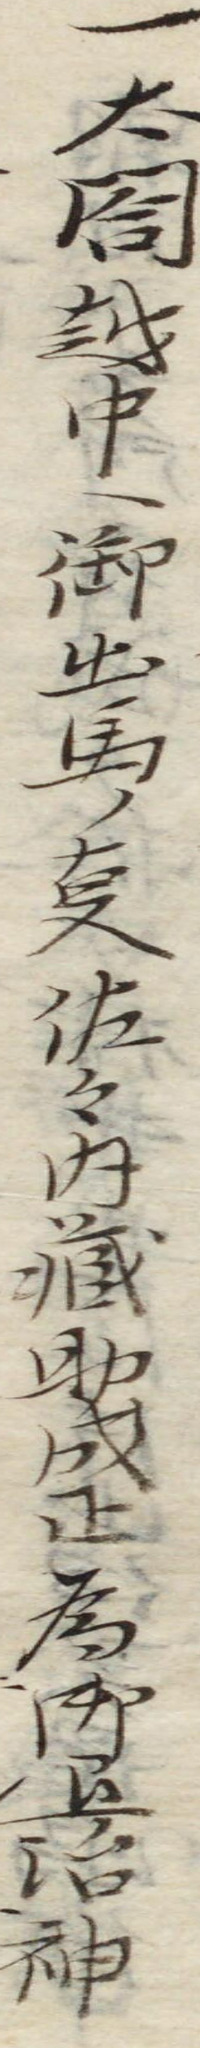一太閤越中へ御出馬事佐々内藏助成正為御退治神
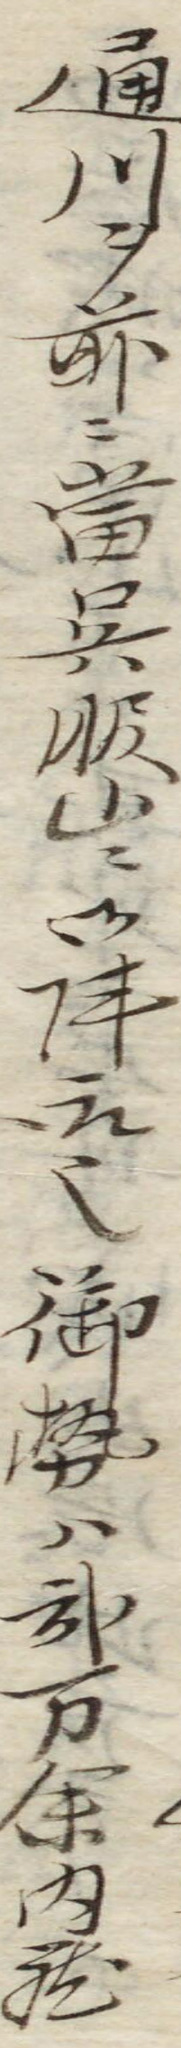通川前ニ當呉服山御拝礼也御勢ハ弐万余内藏
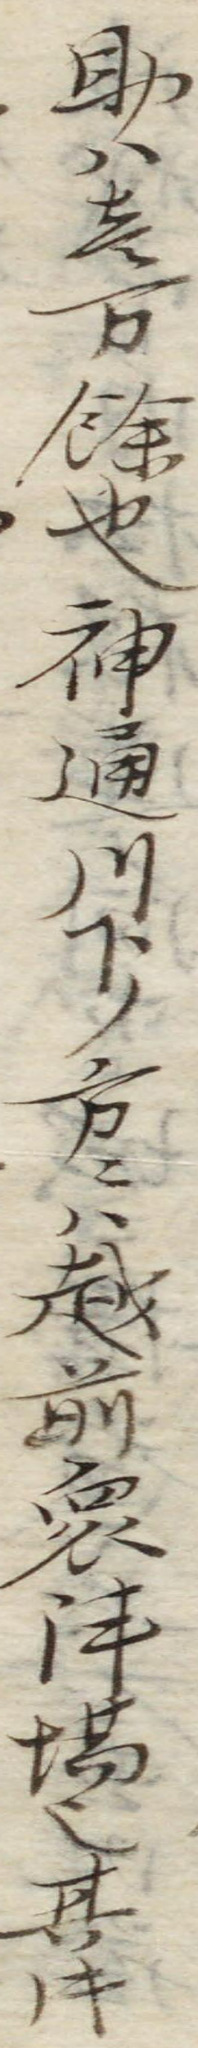助ハ壱万余也神通川下方越前衆拝場也其トキ
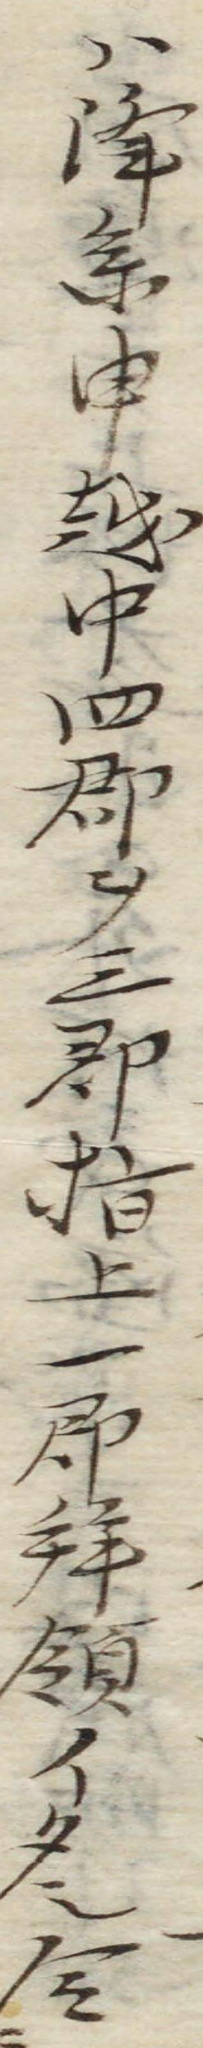ハ降参申越中四郡ヲ三郡差上一群拝領イタシ仕
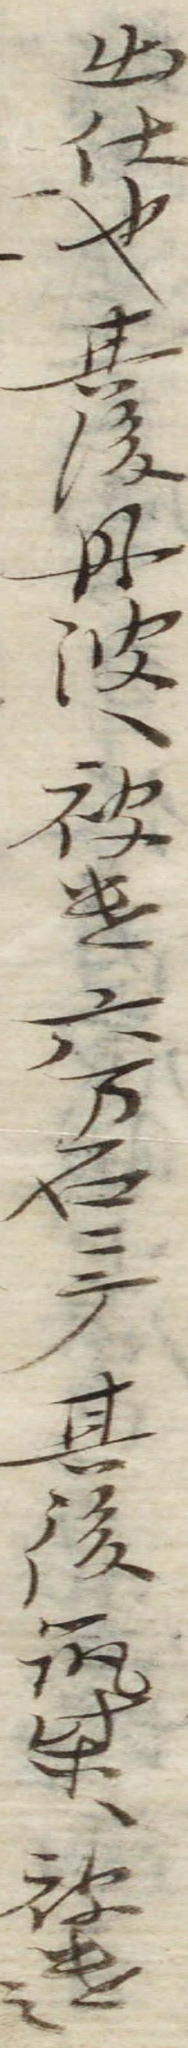出仕也其後丹波ヘ被遣六万石ニテ其後筑紫へ被遣也
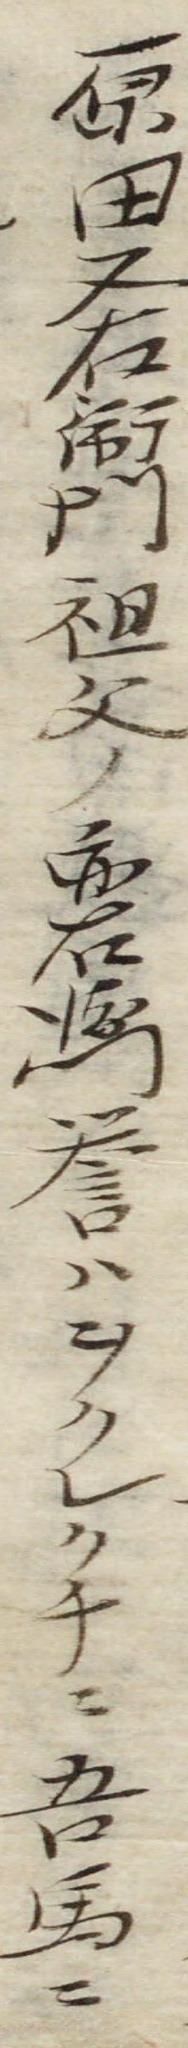一原田又右衛門祖父ノ亦右衛門誉ハヲクレクチニ吾馬ニ
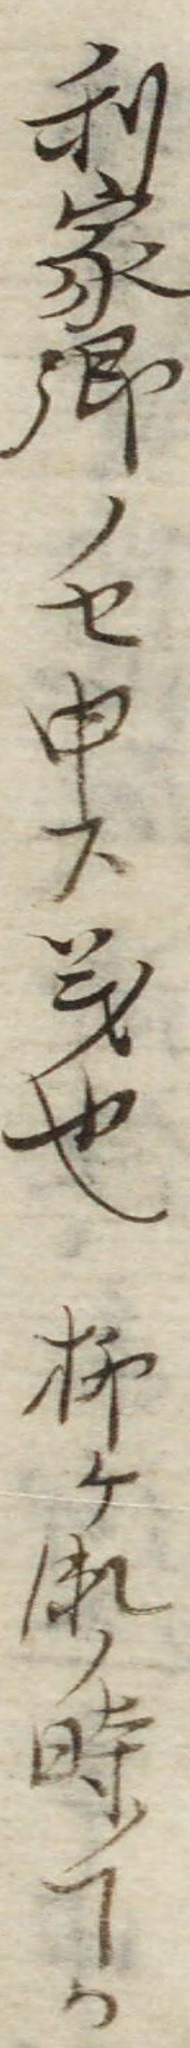利家卿ノセ申ス義也柳ヶ御ノ時コトク

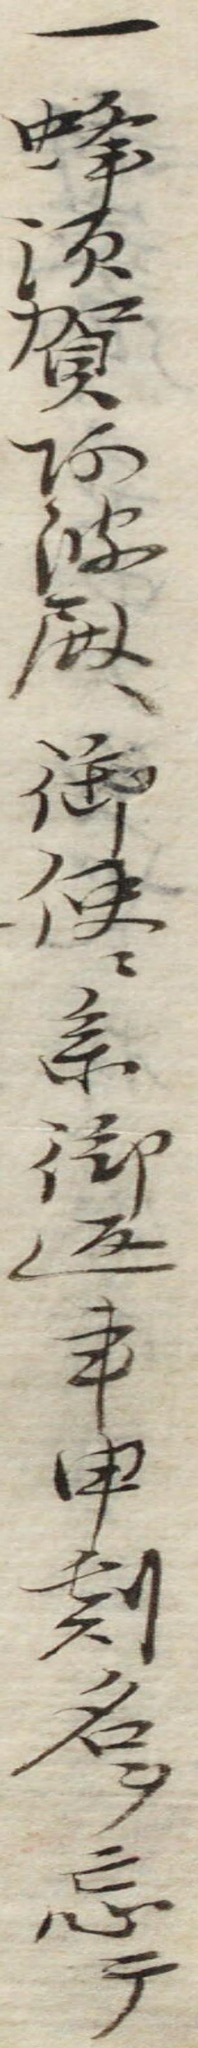一蜂須賀阿波殿へ御使参御返事申刻名忘
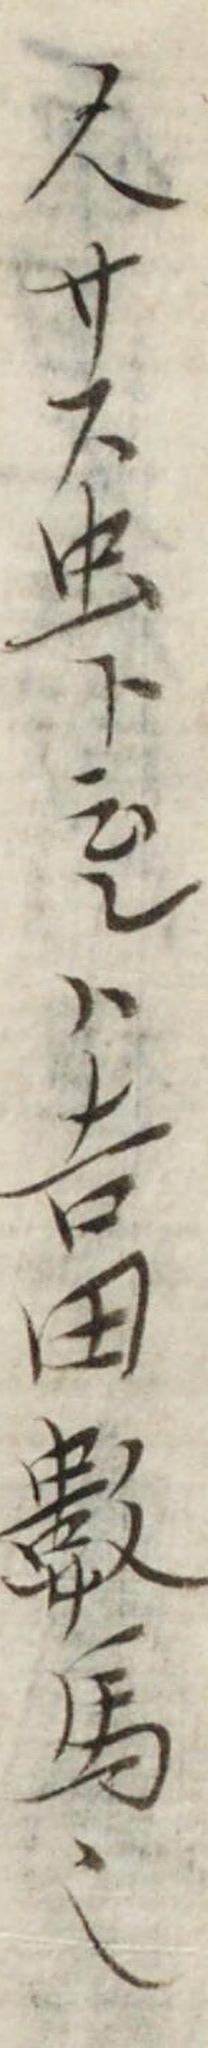人サス虫云ハ吉田数馬成
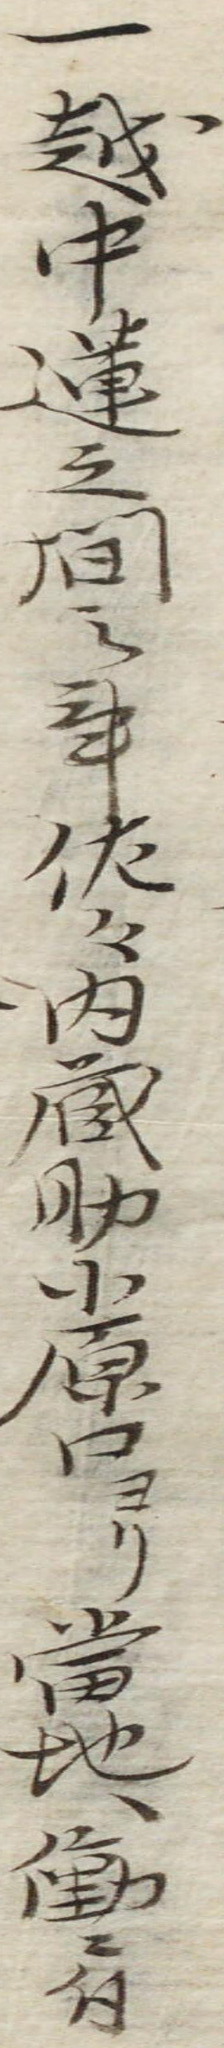一越中遣之間之事佐々内蔵助小原口当地へ働付
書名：聞見雑録
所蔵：Ishikawa Prefectural Library
